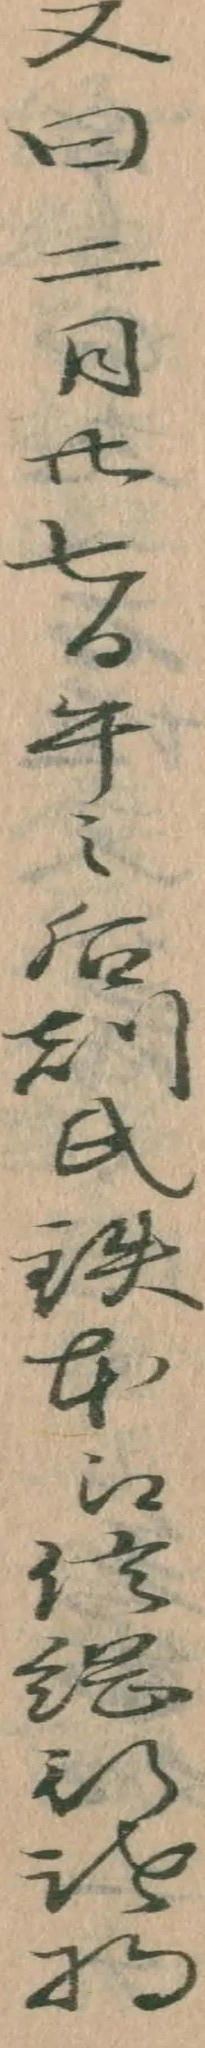又曰二月廿七日午之后刻氏鉄本江信綱行諸将
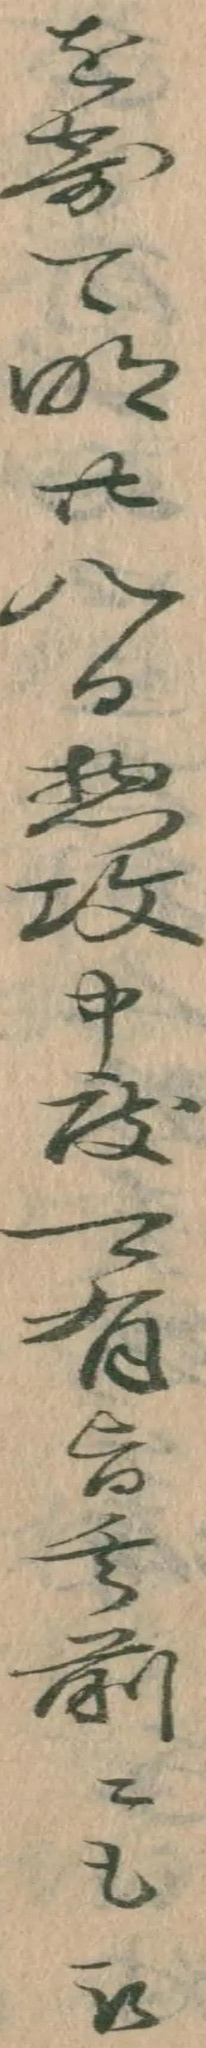を寄て明廿八日惣攻申度可有旨其前にも被
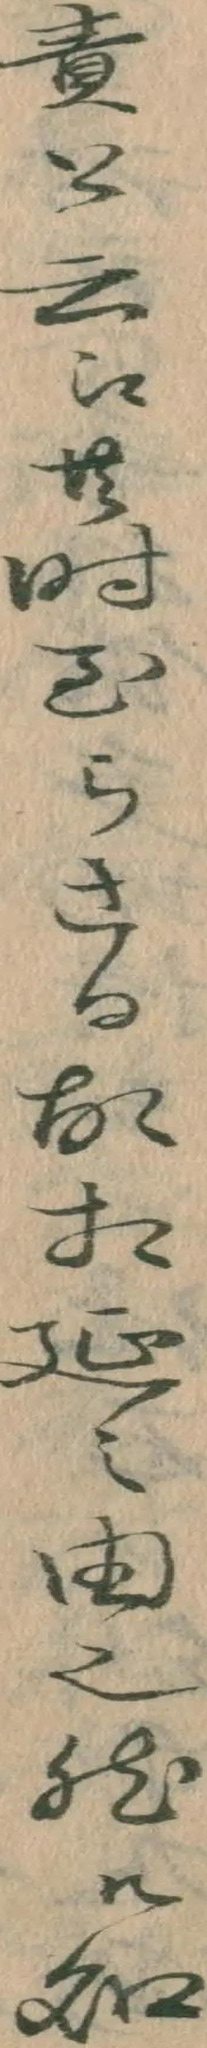責と云江共時至らさる故相延之由也然る処
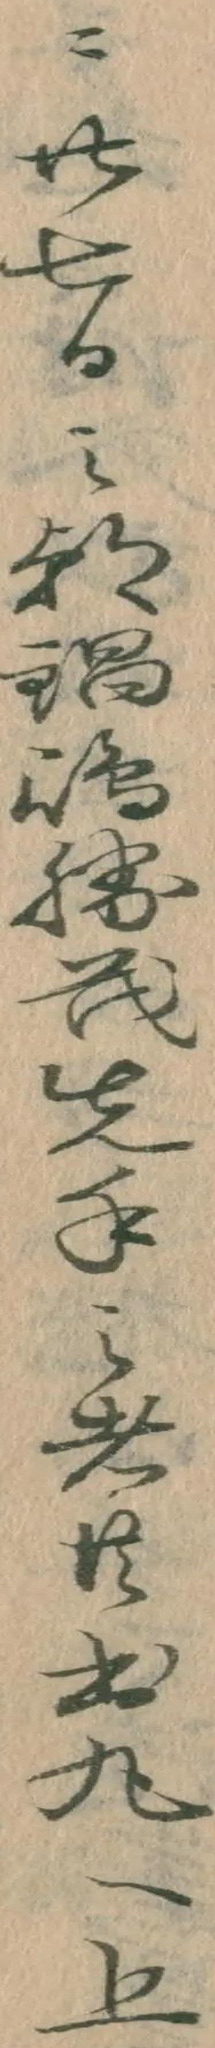に廿七日之朝鍋島勝茂先手之者共出丸へ上
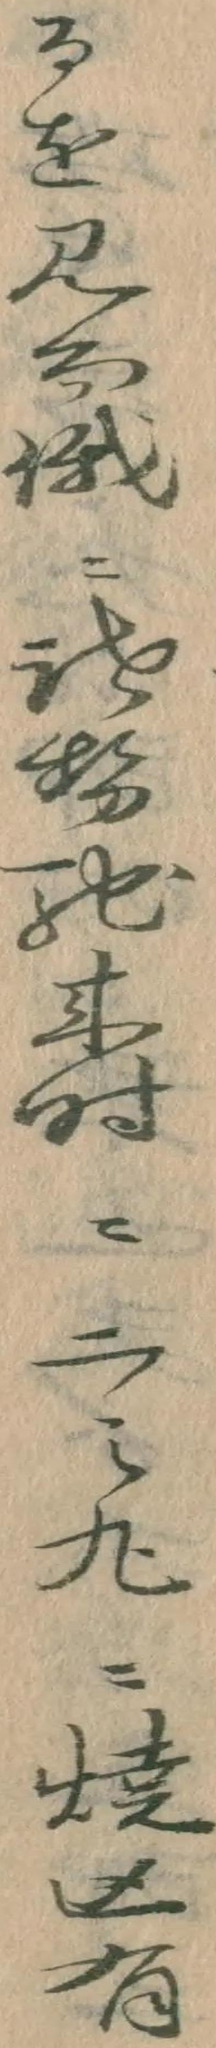るを見而俄に諸勢馳来時に二之丸に焼込有
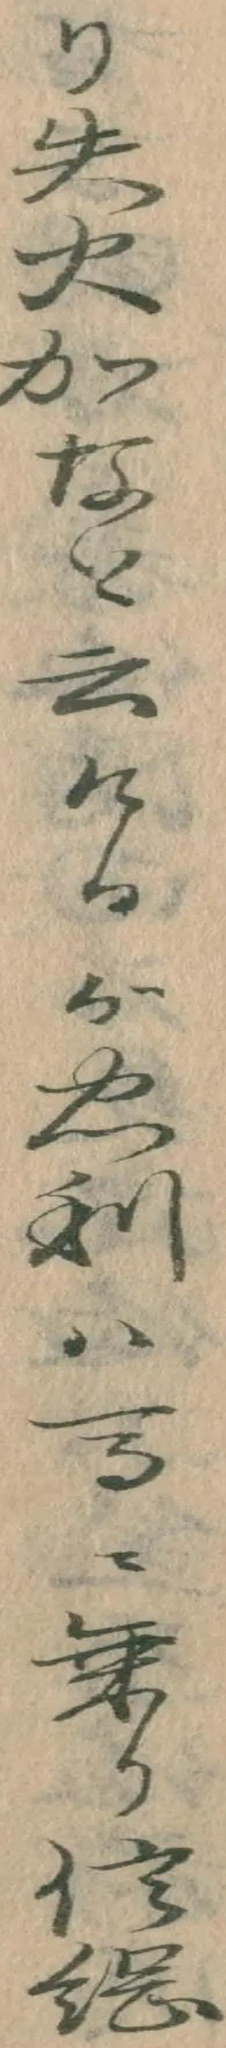り失火加なと云けるか忠利は馬に乗り信綱
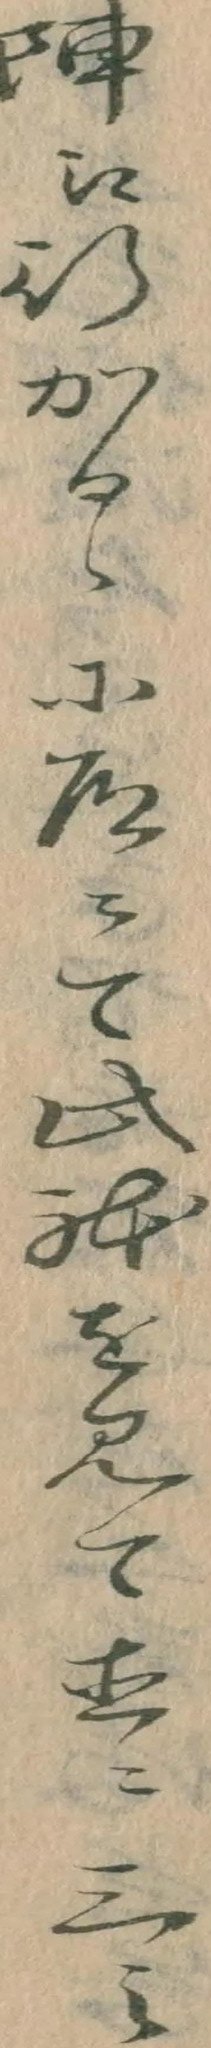陣江行かるゝ尓道にて此躰を見て直に三之
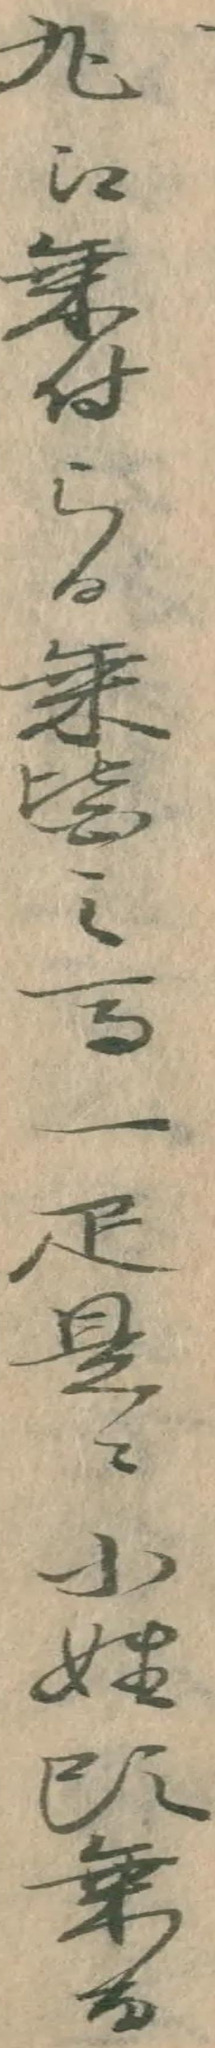丸江乗付らる乗皆之馬一疋是に小姓頭乗る
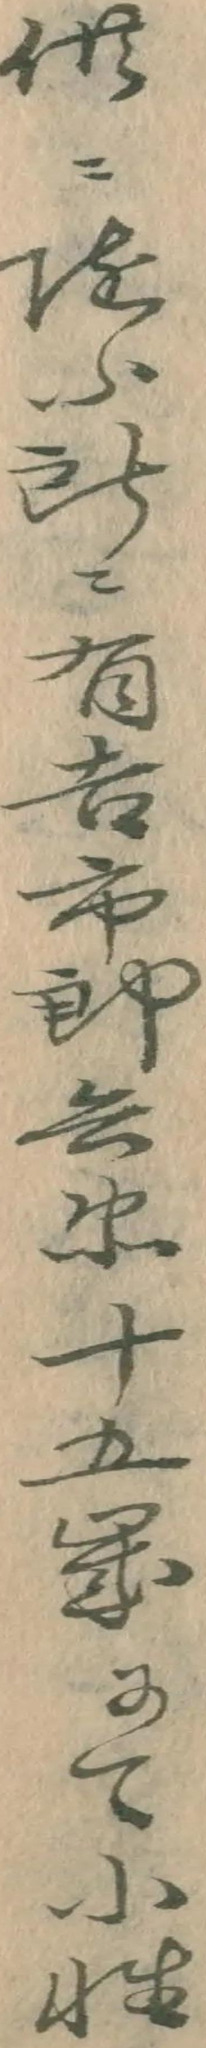供に随ふ所に有吉市郎兵衛十五歳尓て小姓

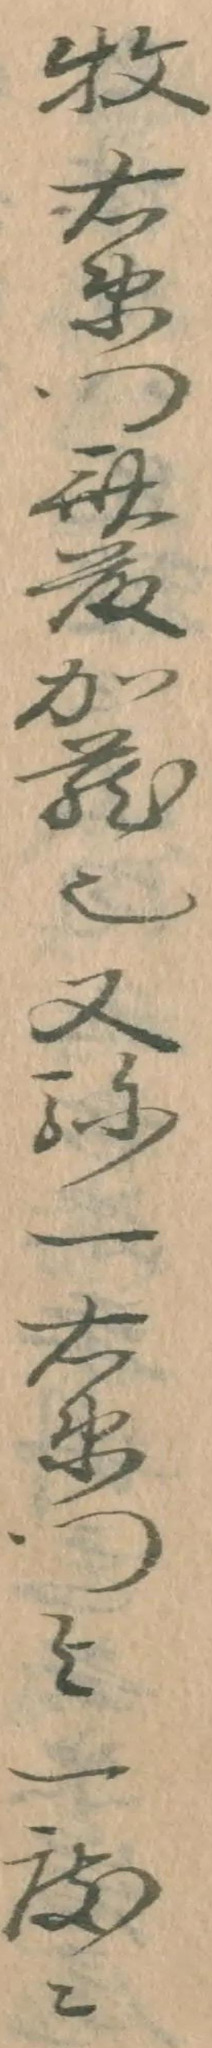牧右衛門斎藤加蔵也又弥一右衛門与一度に
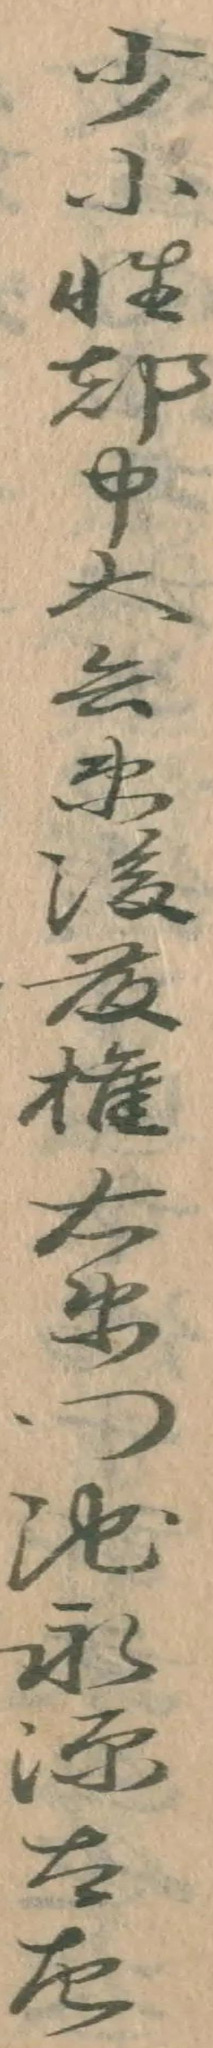少小姓却申大兵衛後藤権右衛門池永源太左
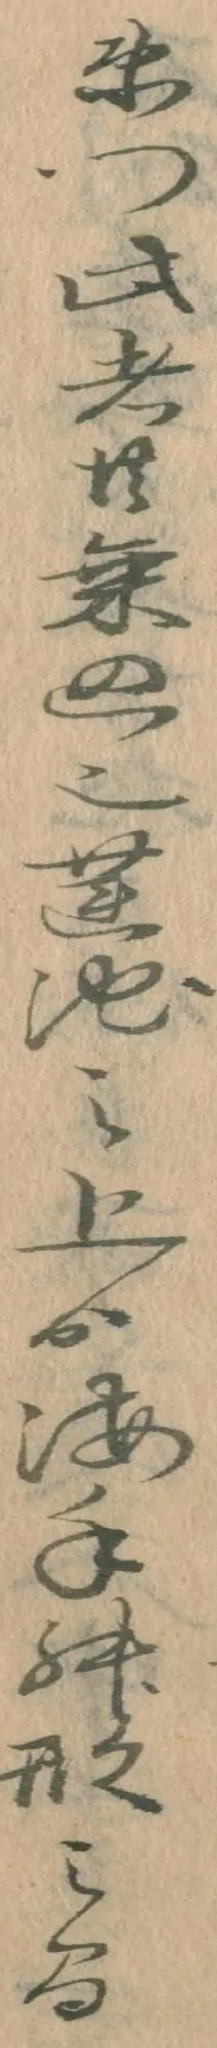衛門此者共乗込也蓮池之上ゟ海手舛形之間
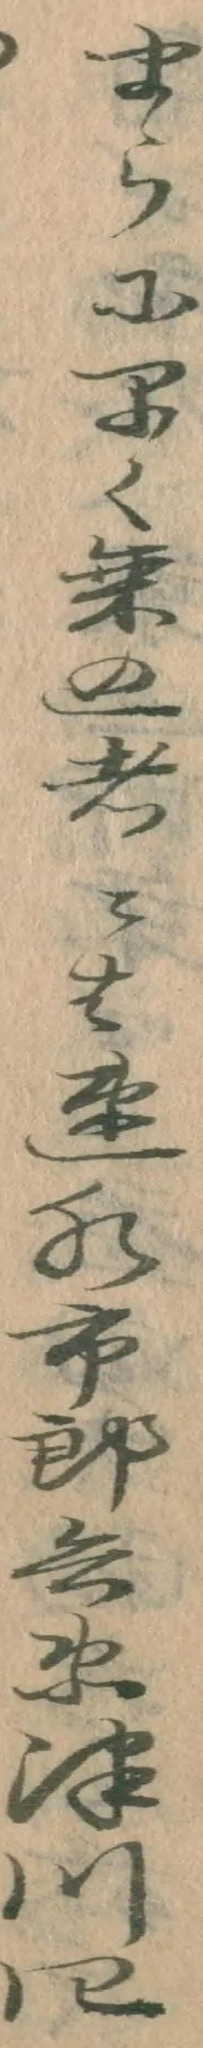半ら尓早く乗込者に者速水市郎兵衛津川四
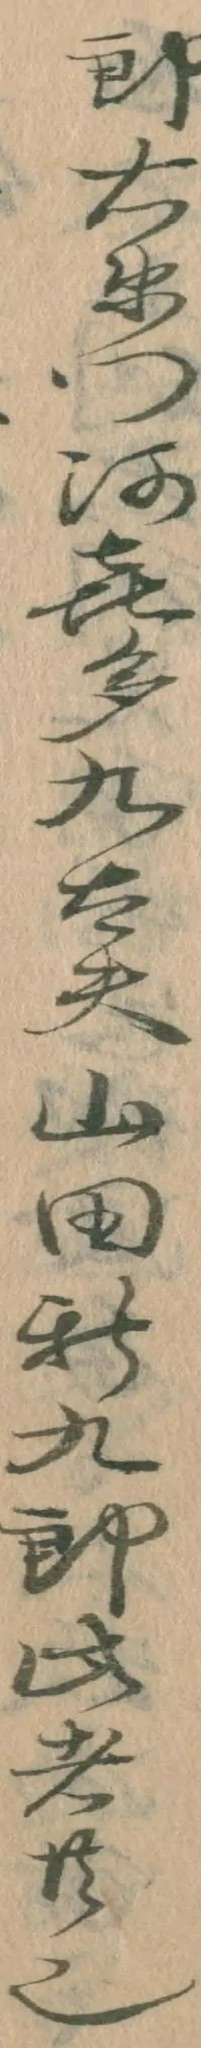郎右衛門河喜多九太夫山田新九郎此者共也
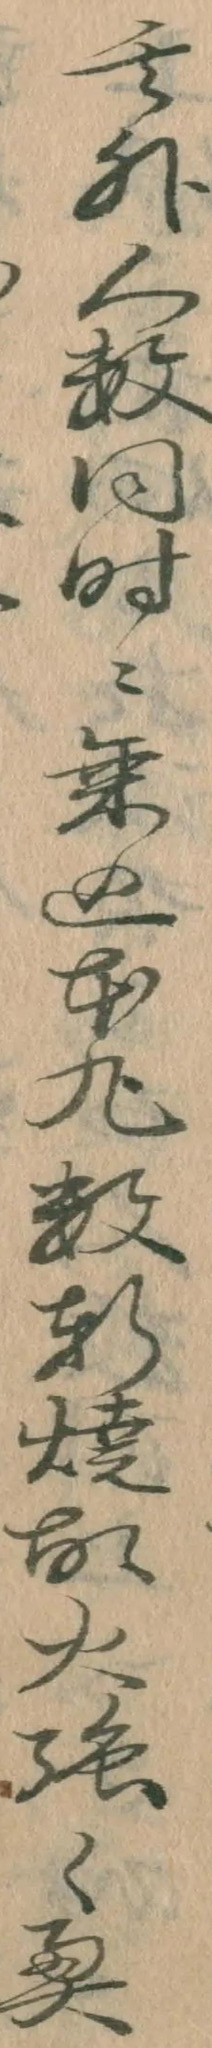其外人数同時に乗込本丸数軒焼故火強く奥
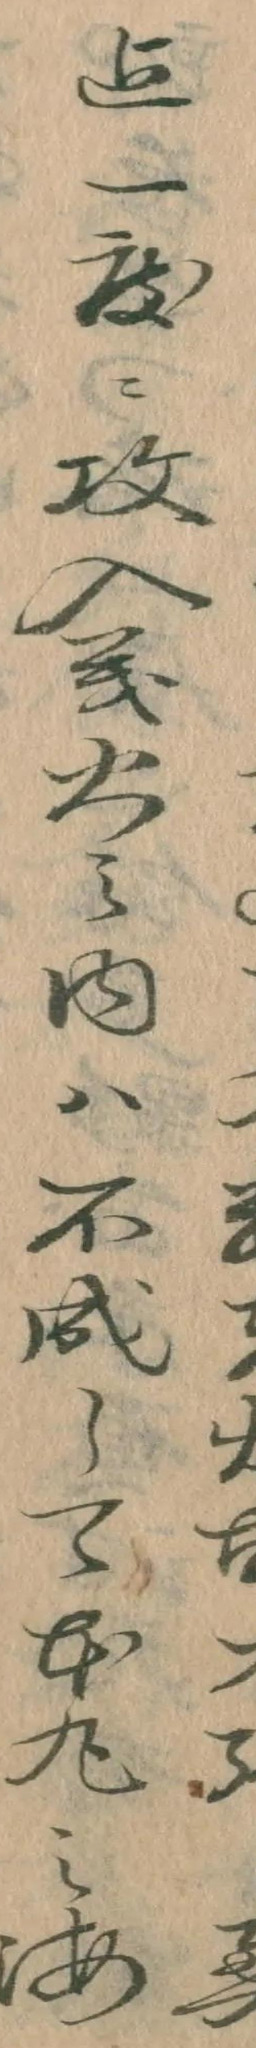迄一度に攻入義火之内は不成して本丸之海
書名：切支丹御退治記 49巻. [7]
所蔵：国立国会図書館 National Diet Library, JAPAN
